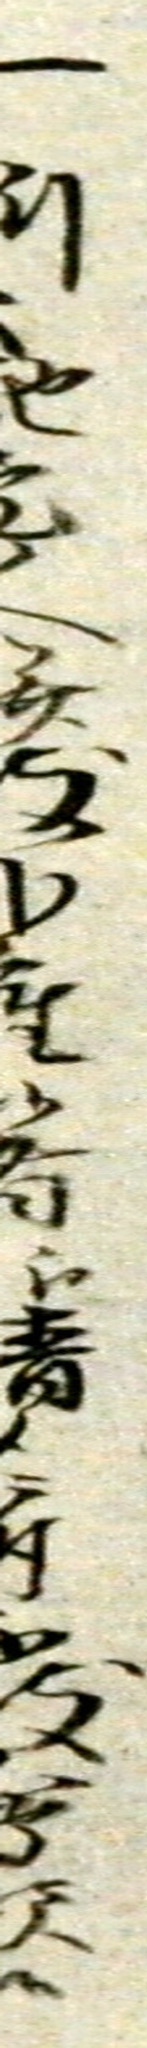一所々馳走人幷致下座候者江清メ二付不致会釈候

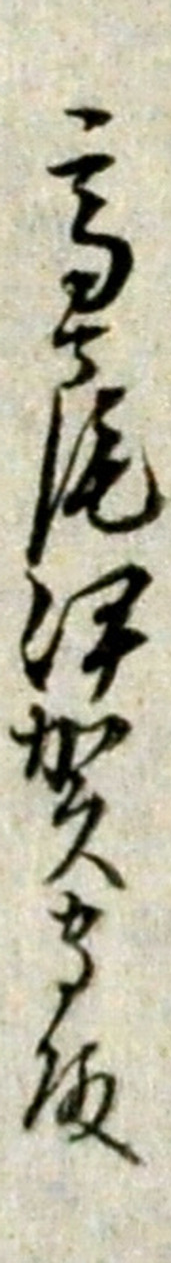高尾伊賀守殿
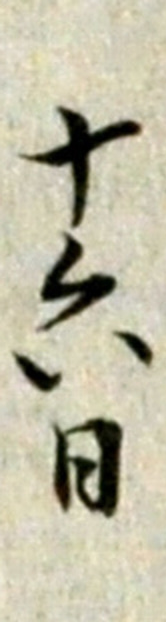十六日
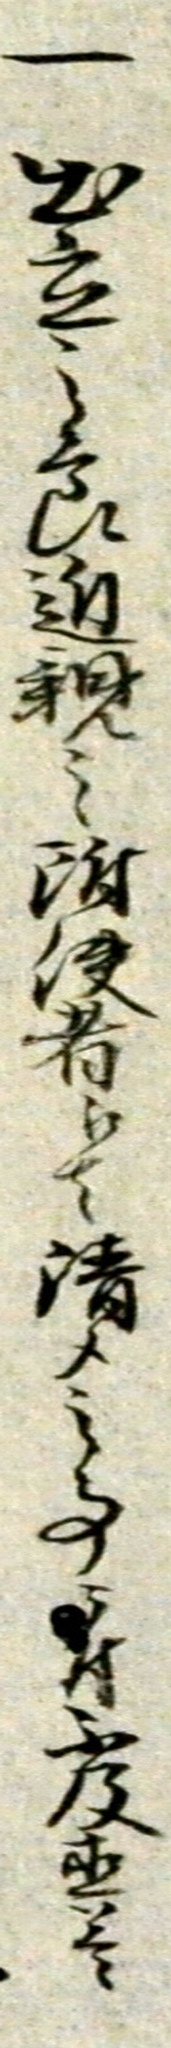一出立之節近親之附使者江者清〆之事ニ付不及直其
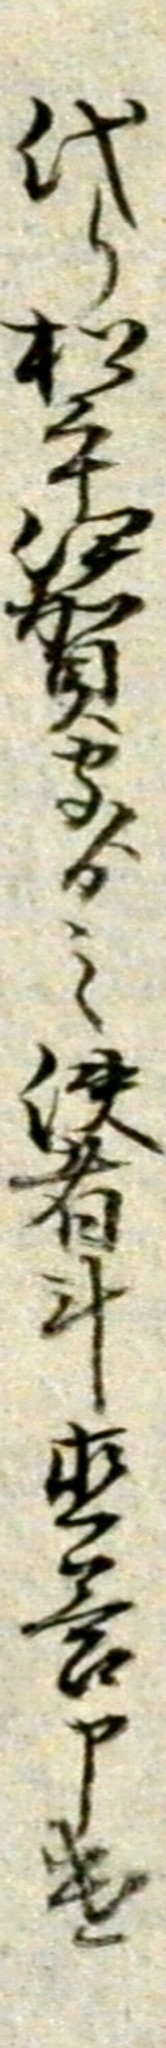代り松平伊賀守ゟ之使者計直答申遣
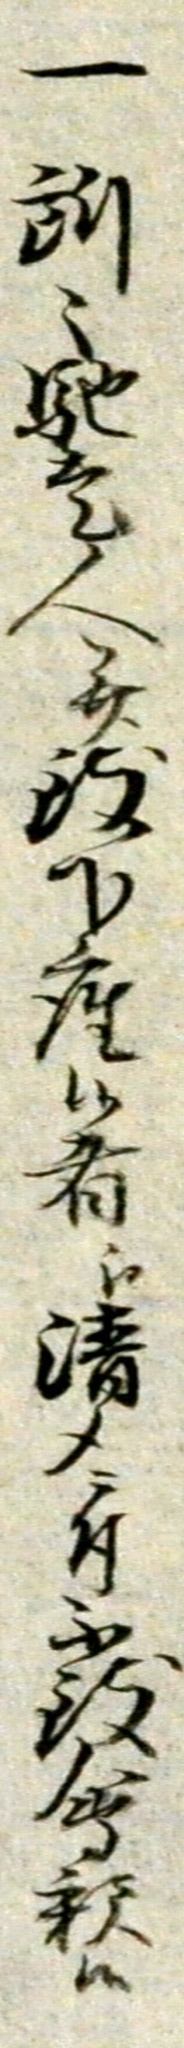一所之馳走人幷致下座候者江清メニ付不致会釈候
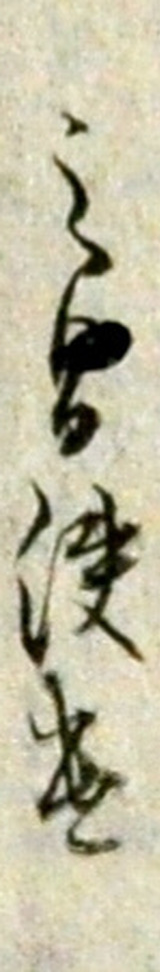之間使遣
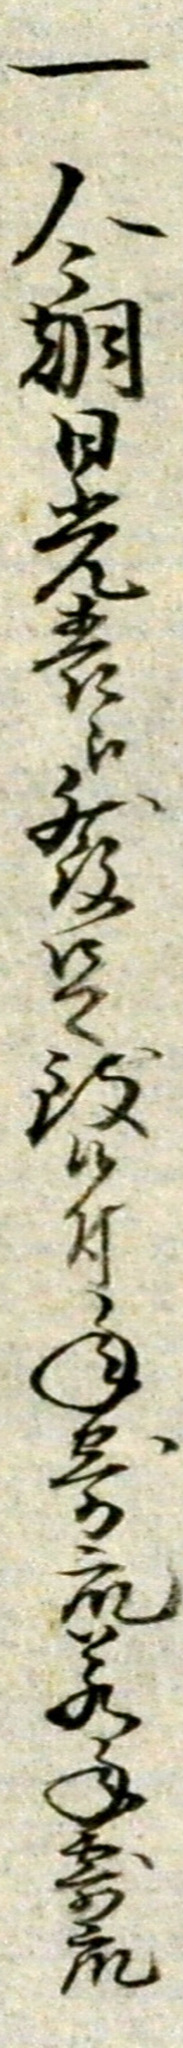一今朝日光表江発足致候付年寄衆若年寄衆
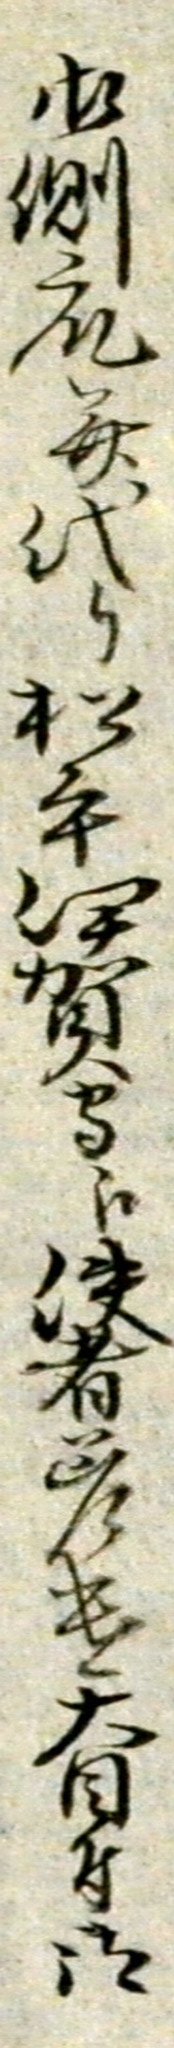御側衆幷代り松平伊賀守江使者差遣大目付御
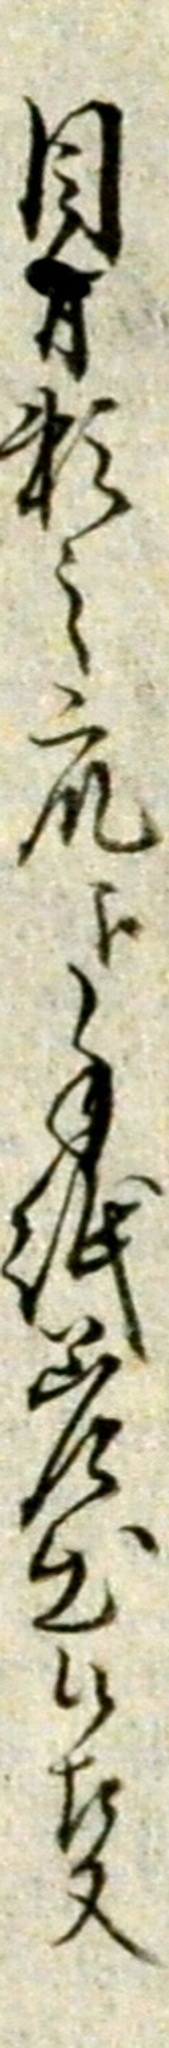目付頼之衆江手紙差出候事
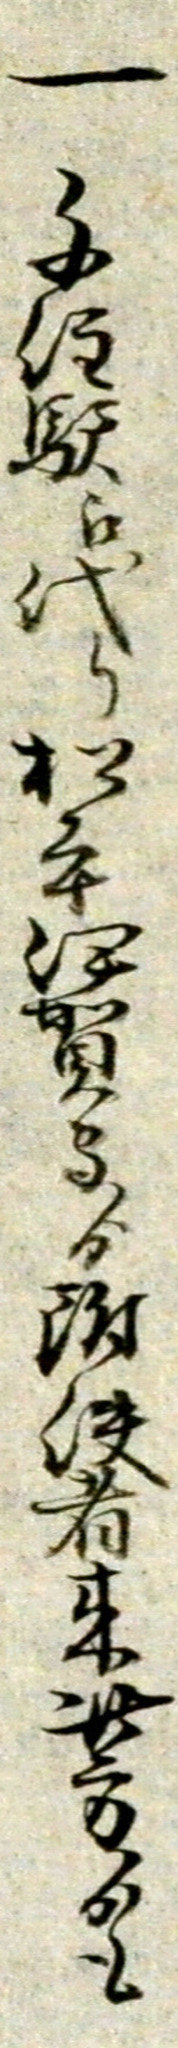一千住駅江代り松平伊賀守ゟ附使者来此方ゟも
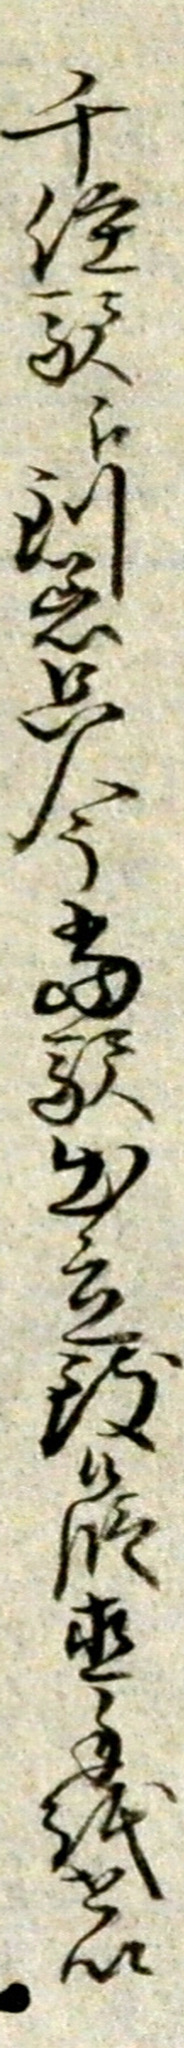千住駅江到着只今当駅出立致候段直手紙を以
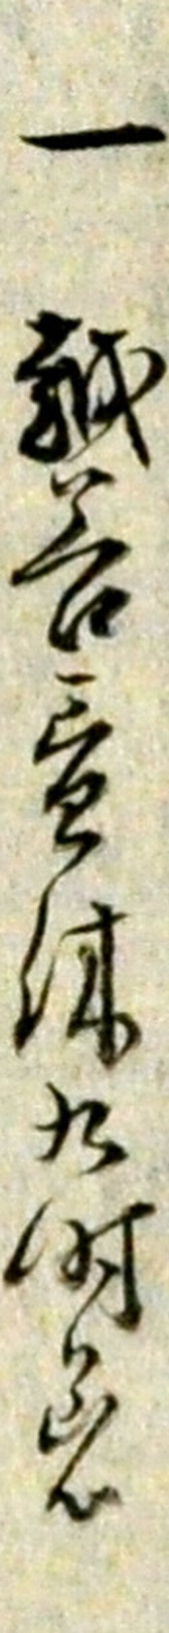一越谷昼休九時着
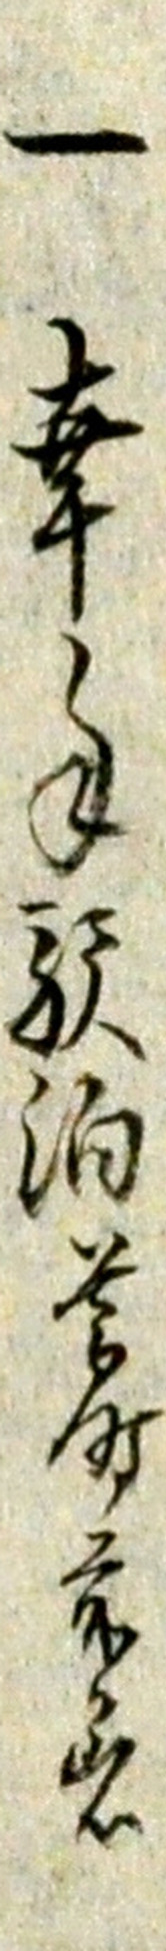一幸手駅泊暮時前着
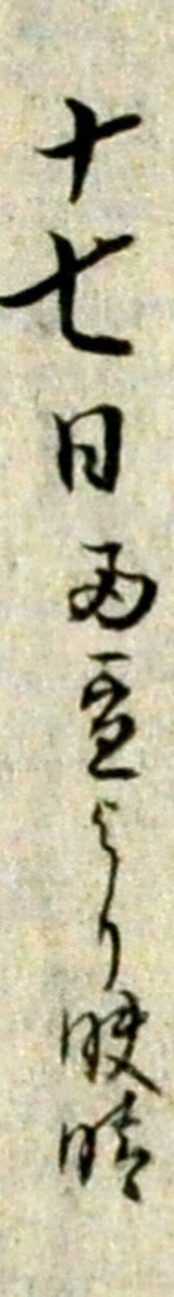十七日雨昼より快晴
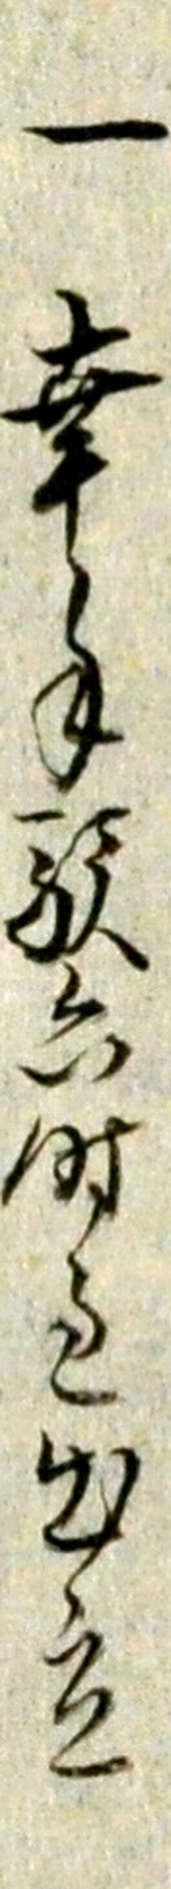一幸手駅六時過出立
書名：日光御名代相勤候節ノ留
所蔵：伊那市立高遠町図書館・合同会社AMANE
